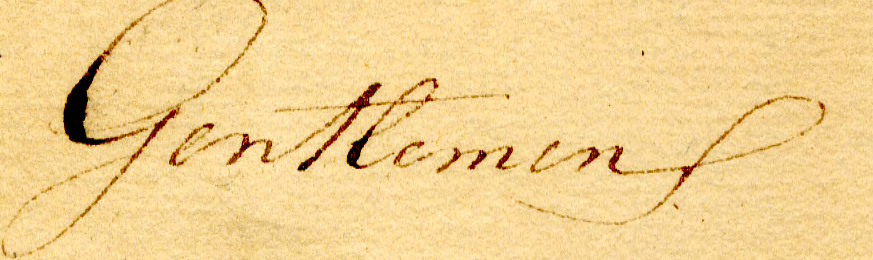Gentlemen
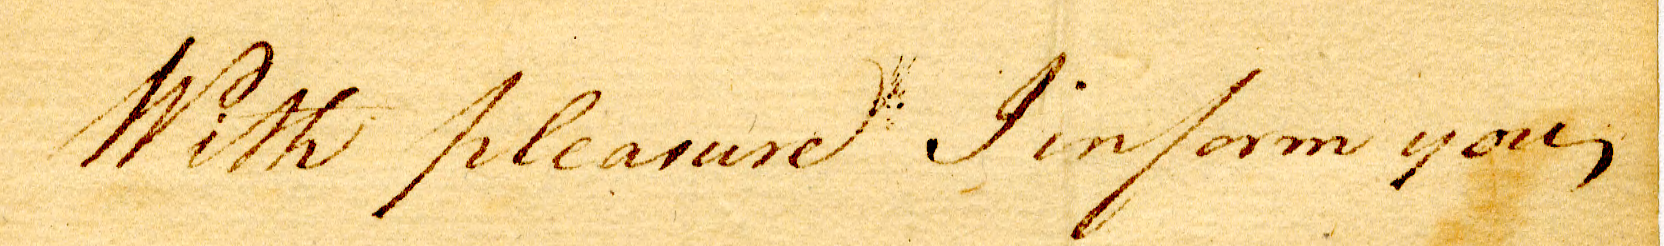With pleasure I inform you
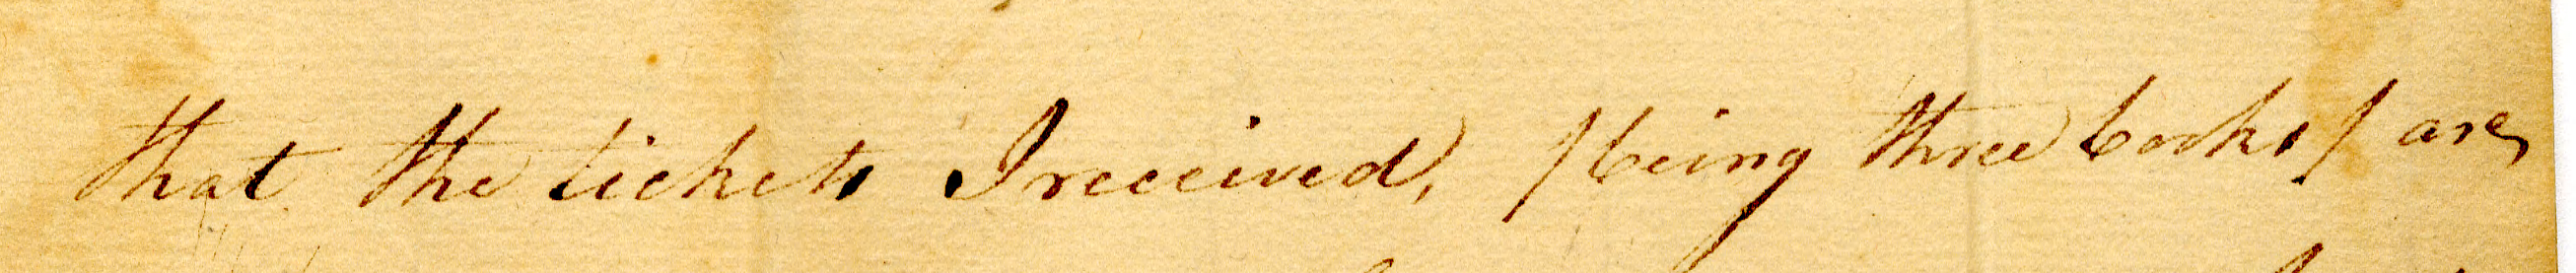that the tickets I received, /being three books/ are
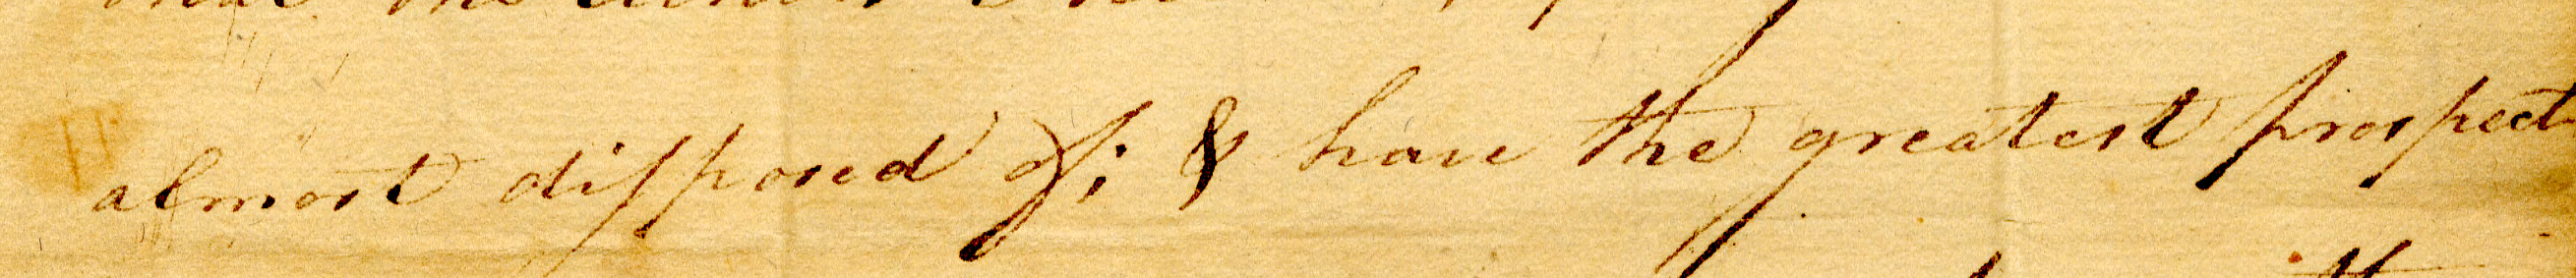almost disposed of; & I have the greatest prospect
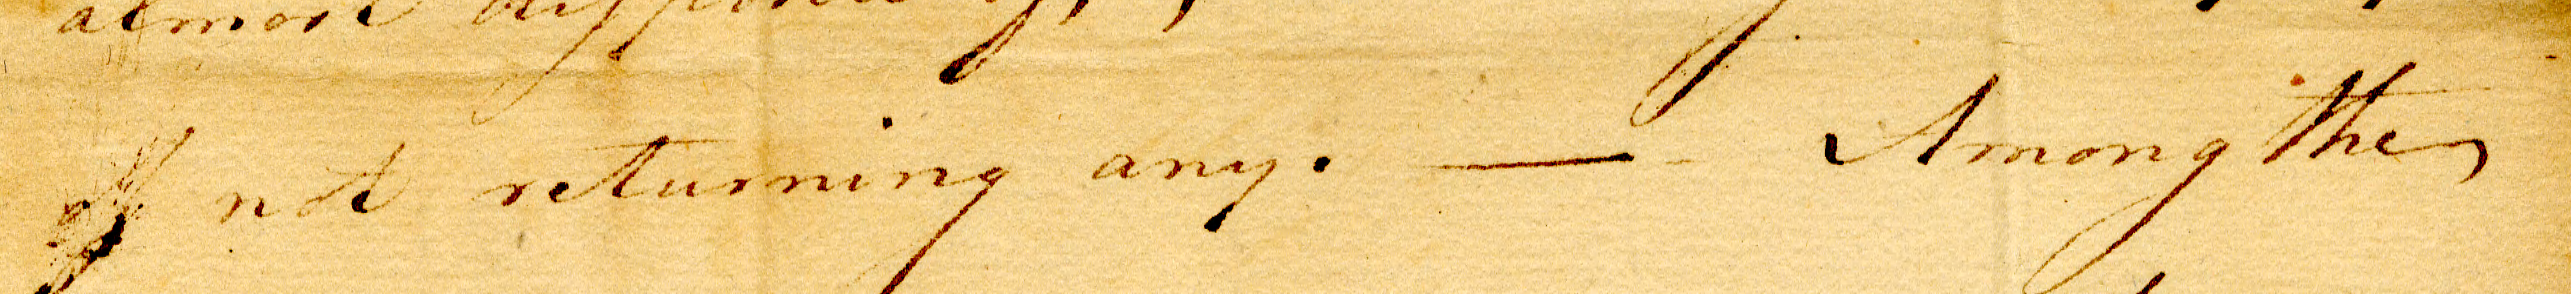of not returning any.- Among the
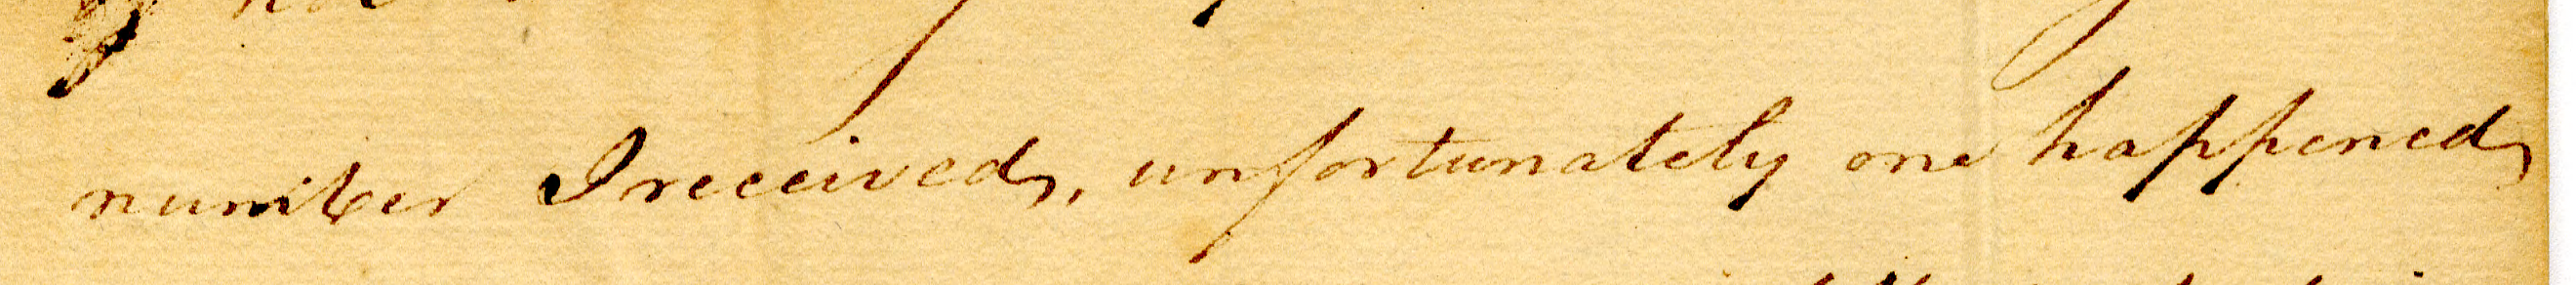number I received, unfortunately one happened
